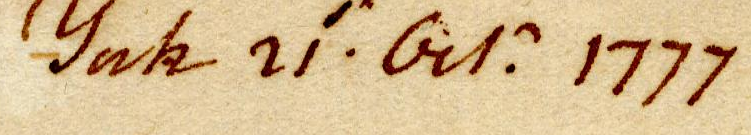York 21^st. Oct^r. 1777
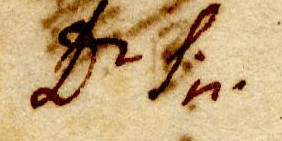D^r Sir.
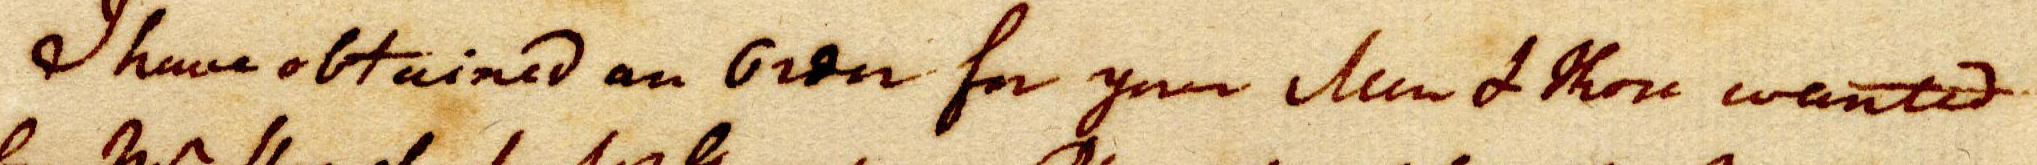I have obtained an Order for your seen & those wanted
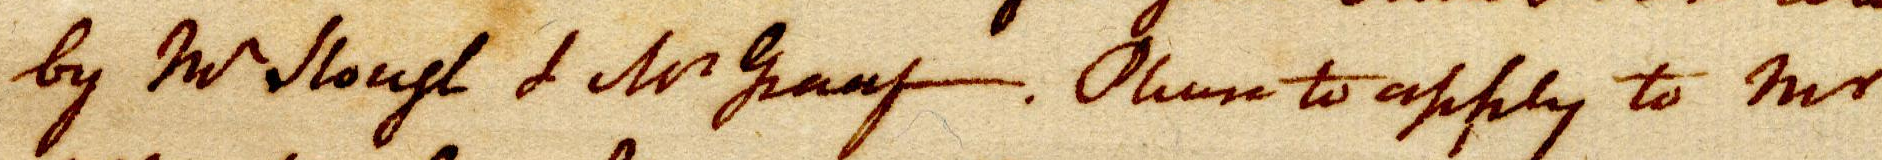by M^r Slough & M^r Graaf. Please to apply to M^r
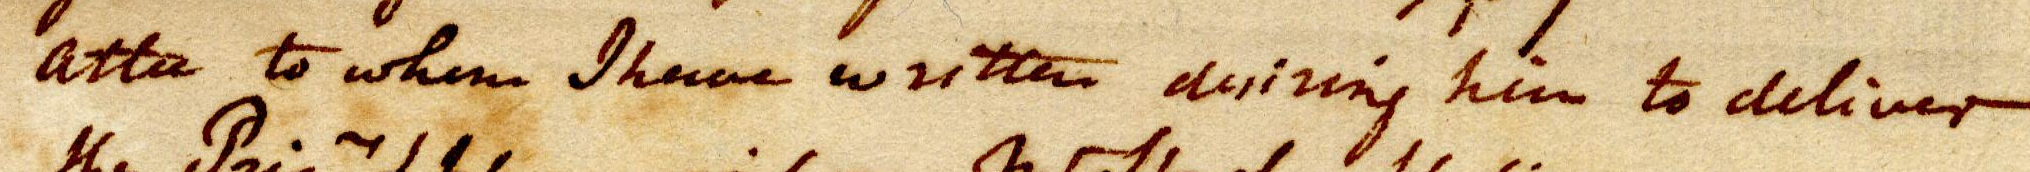Atter to whom I have written desiring him to deliver
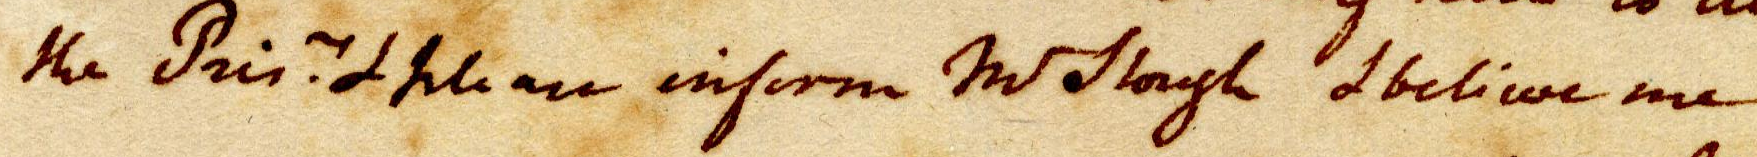the Pris^d. & please inform M^r Slough I believe me
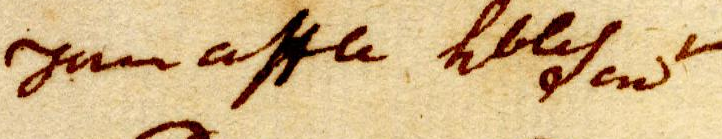Your affte hble Serv^t
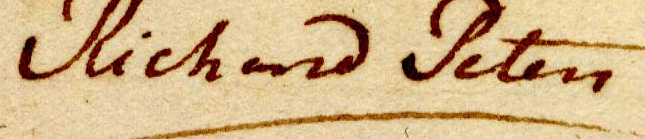Richard Peters
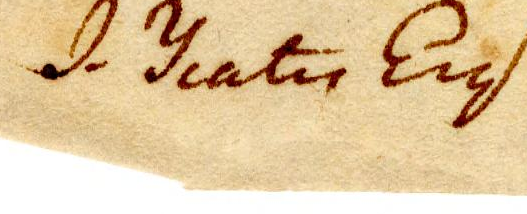J. Yeates Esq^r
